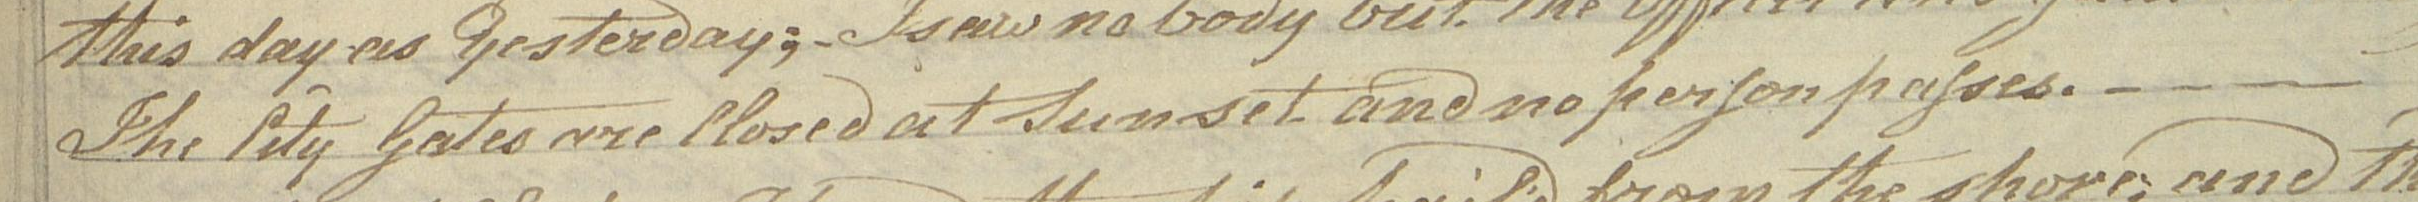The City Gates are closed at Sunset and no person passes.
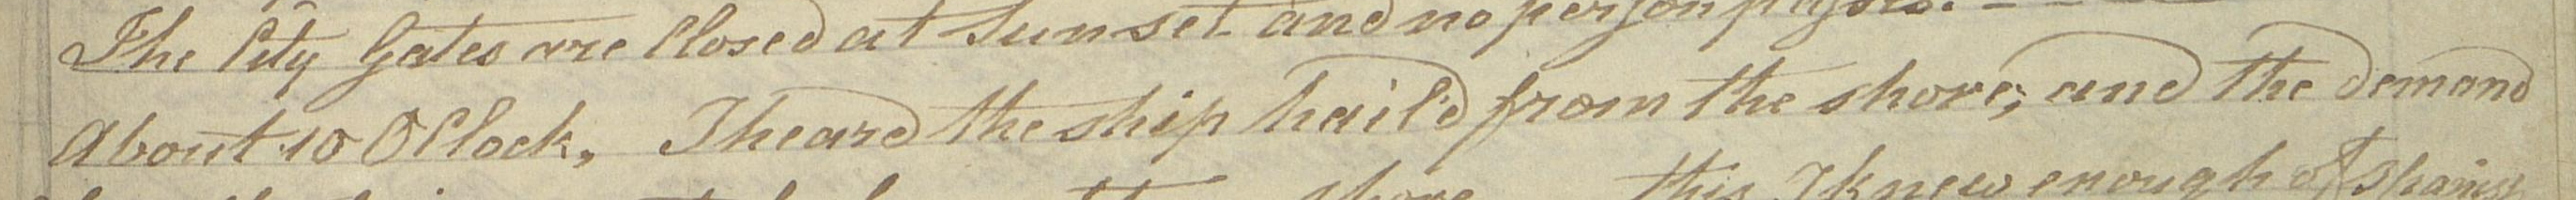About 10 OClock. I heard the ship haild from the shore and the demand
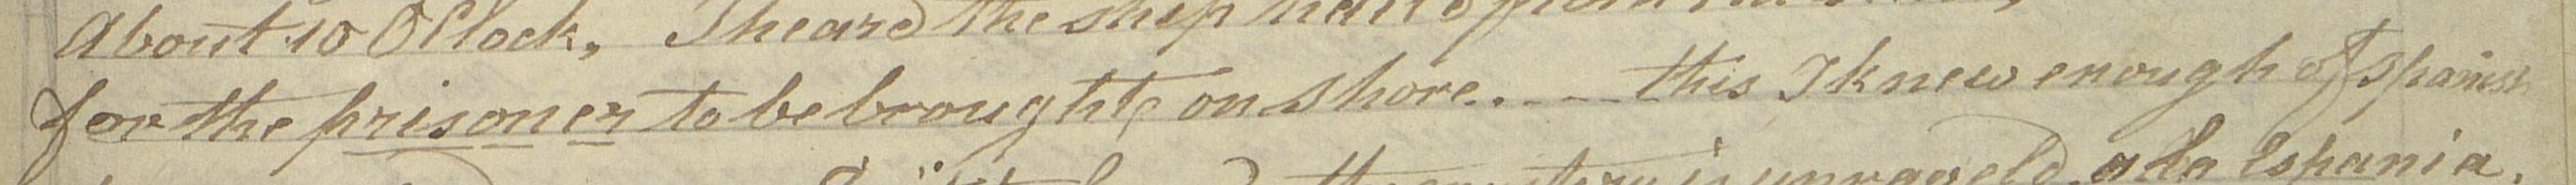for the prisoner to be brought on shore. this I know enough of spanish
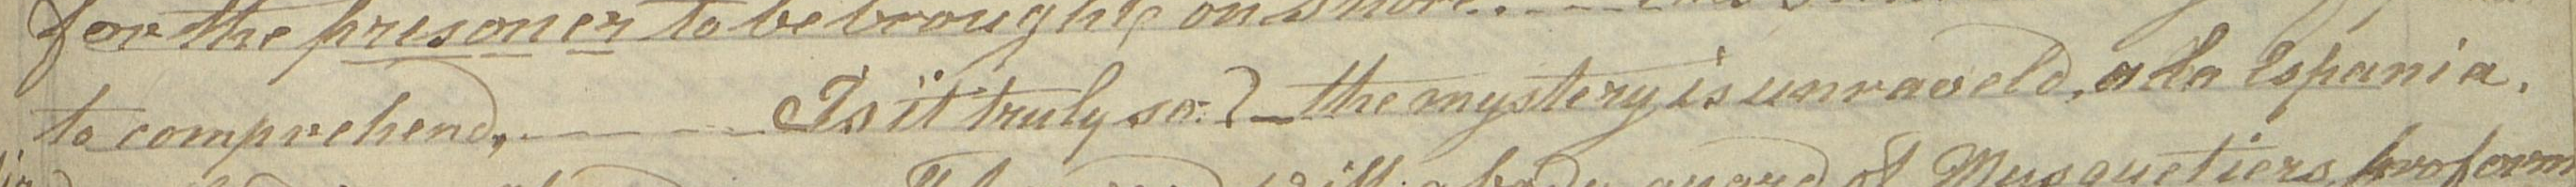to comprehend, Is it truly so? the mystery is unraveld a La Espania.
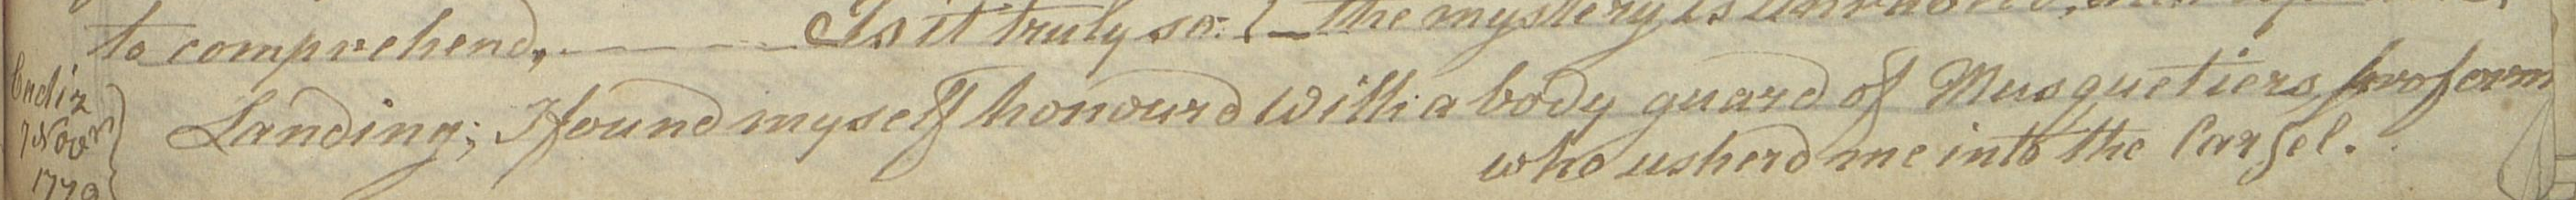Cadiz 7 Nov^r Landing; I found myself honourd with a body guard of Musquetiers proform
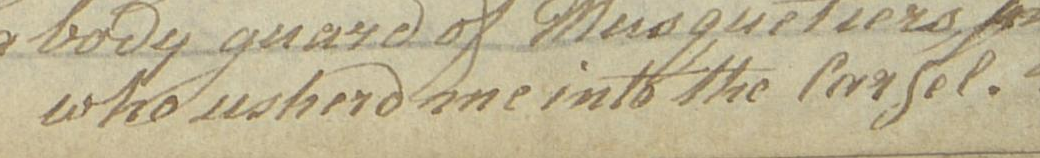who usherd me into the Carsel.
